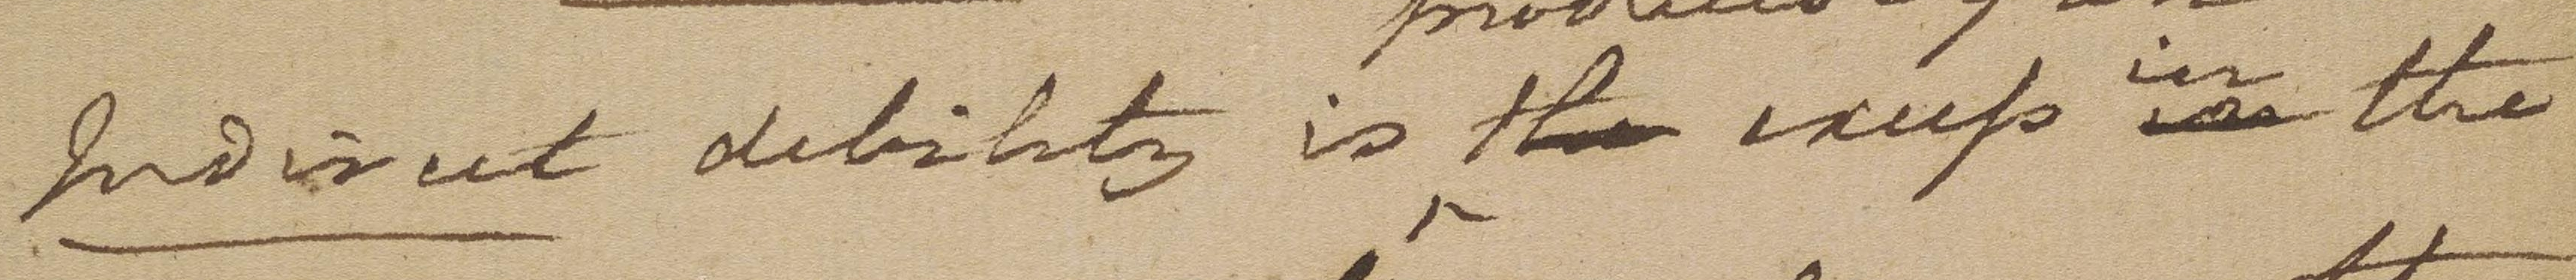Indirect debility is ^ excess in the
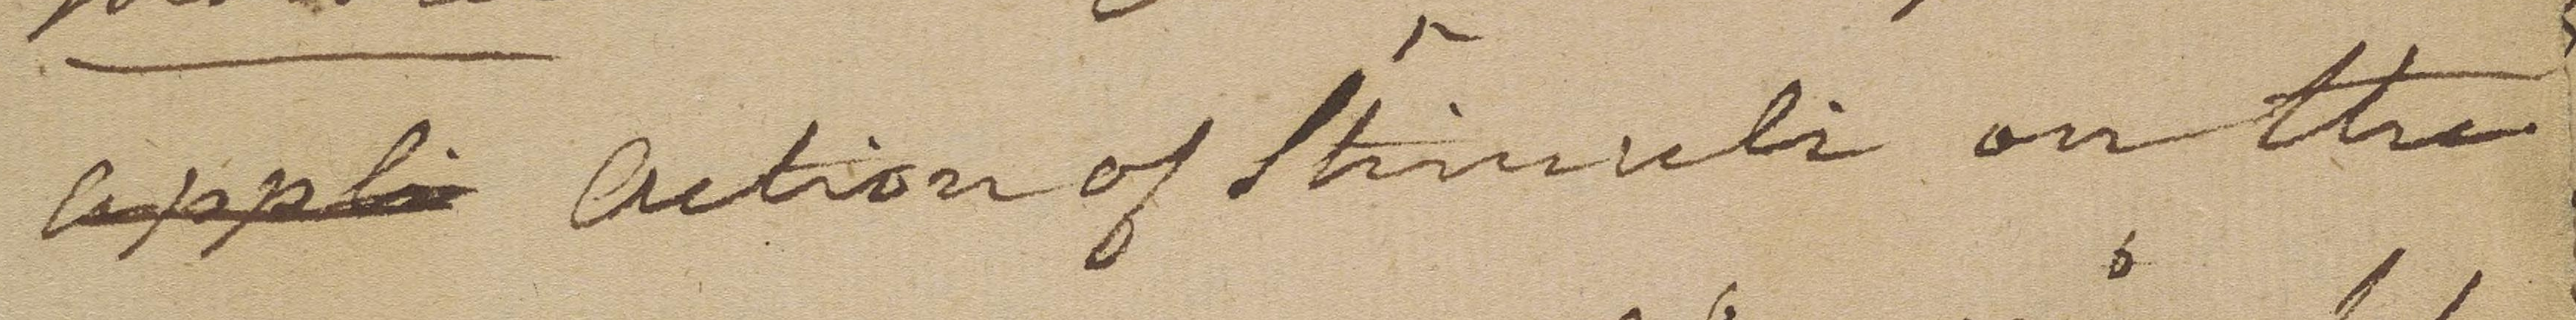action of stimuli on the
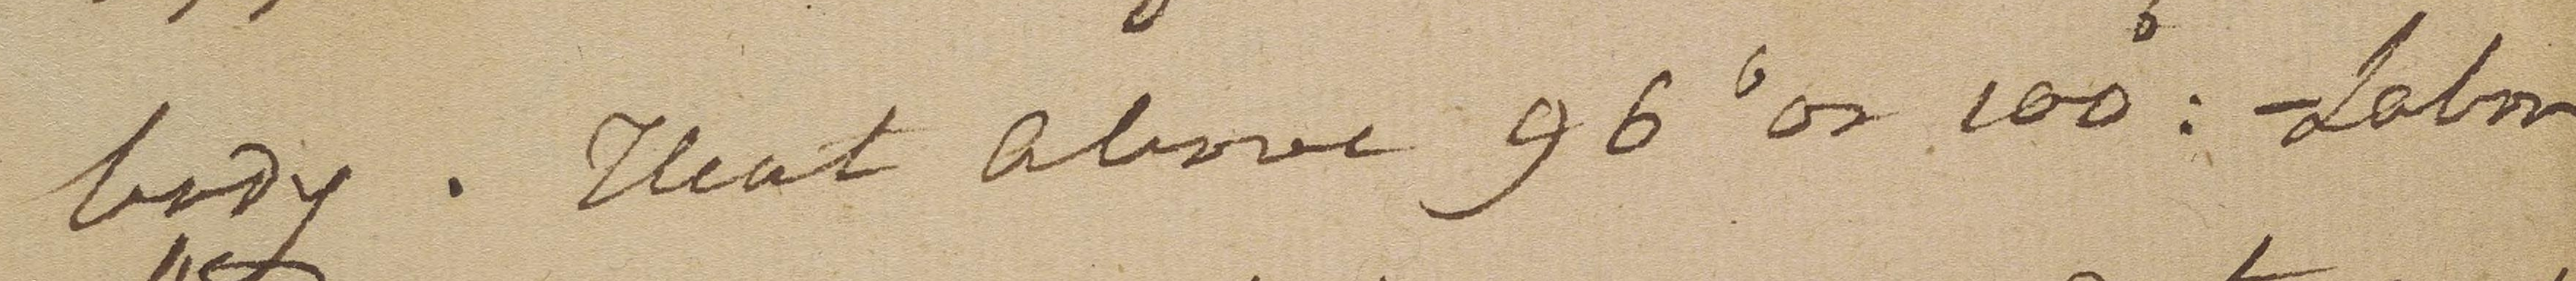body. Treat above 96^° or 100^°: Labor
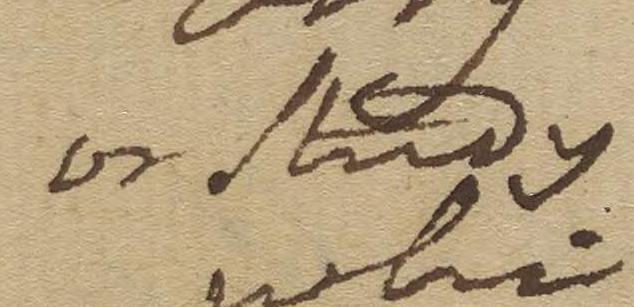or study
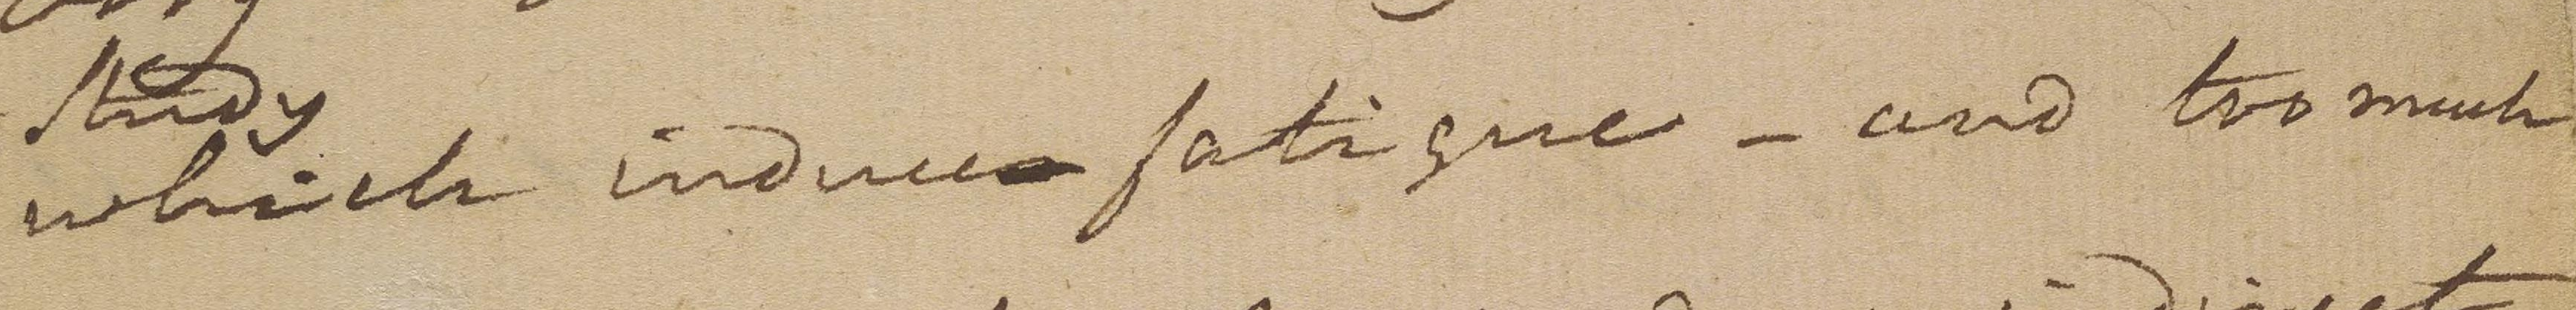which induce fatigue, and too much
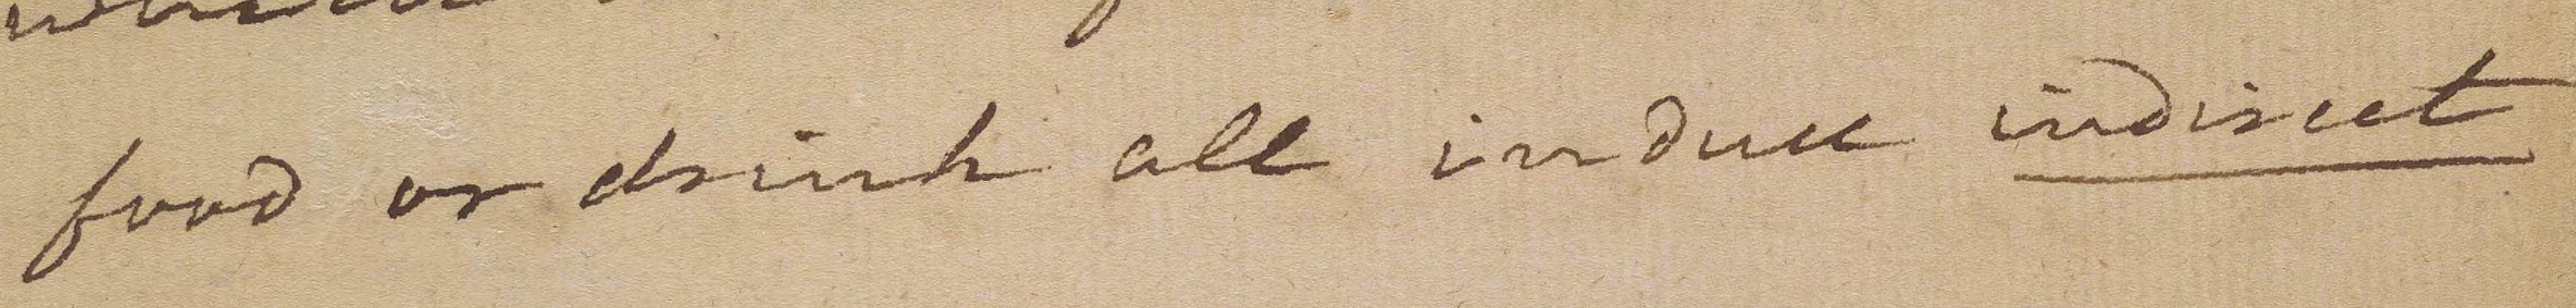food or drink all induce indirect
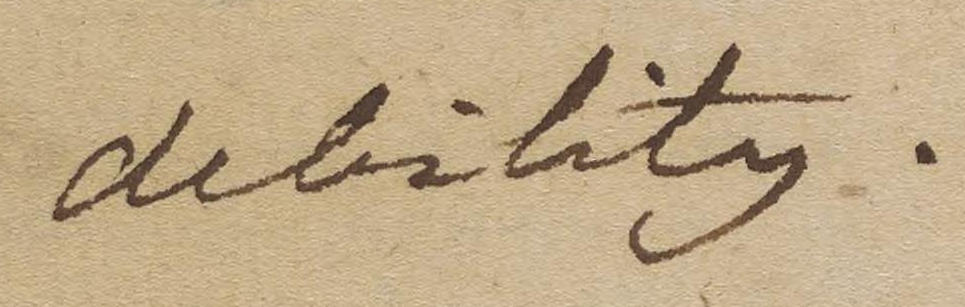debility.
